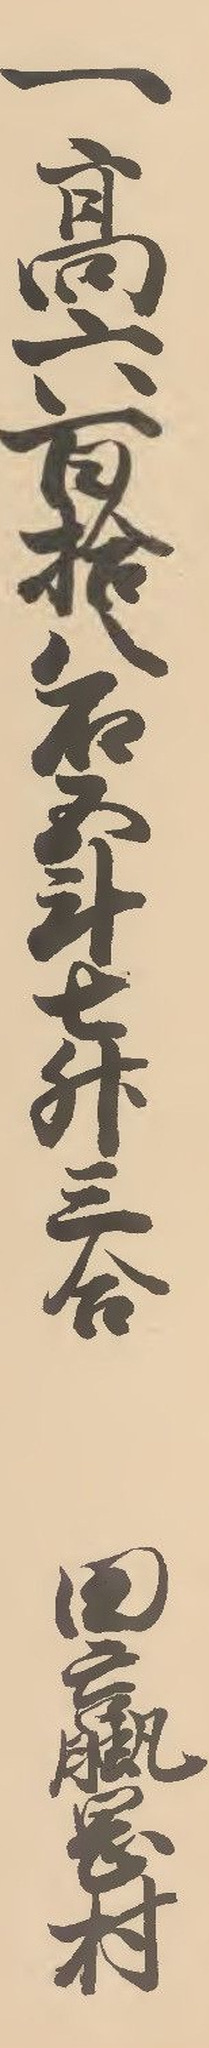一高六百拾八石五斗七升三合田蠃岡村
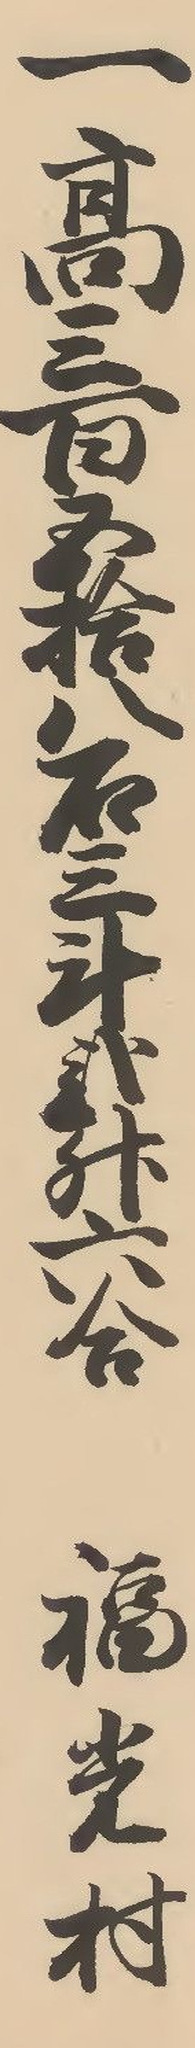一高三百五拾八石三斗弐升六合福光村
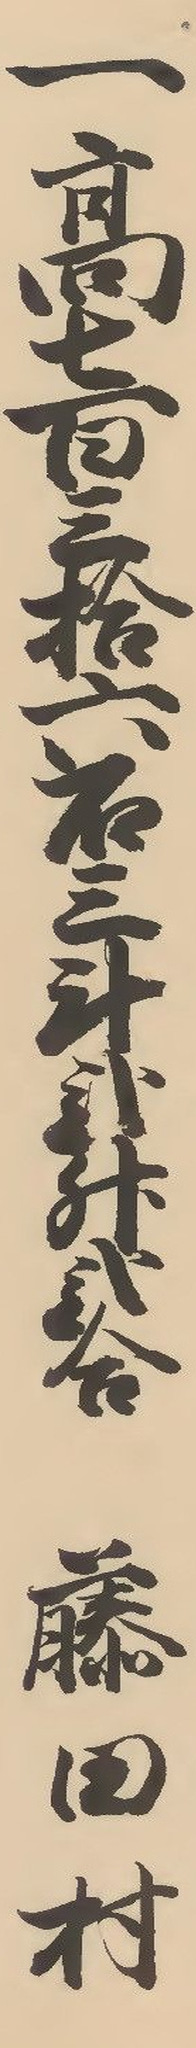一高七百三拾六石三斗弐升弐合藤田村
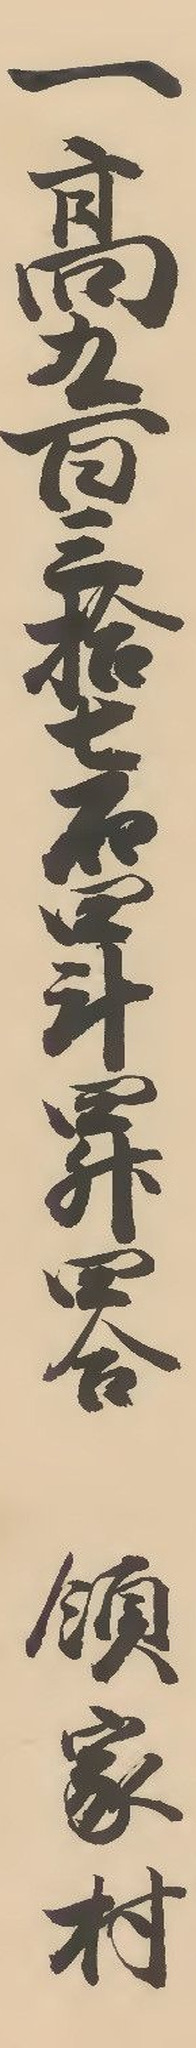一高九百三拾七石四斗四升四合領家村

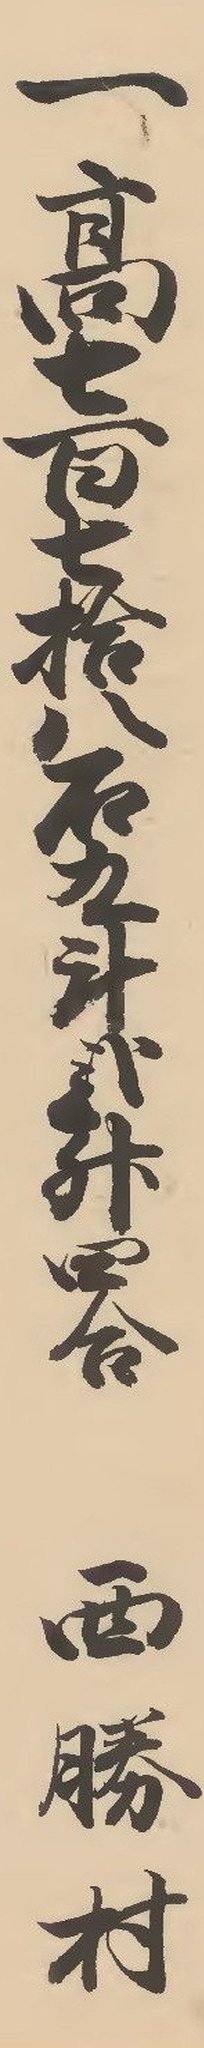一高七百七拾八石九斗弐升四合西勝村
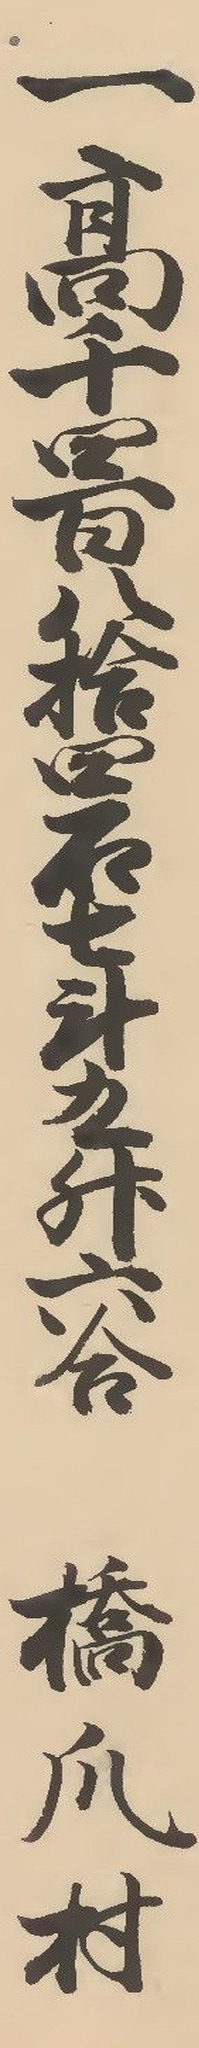一高千四百八拾四石七斗九升六合橋爪村
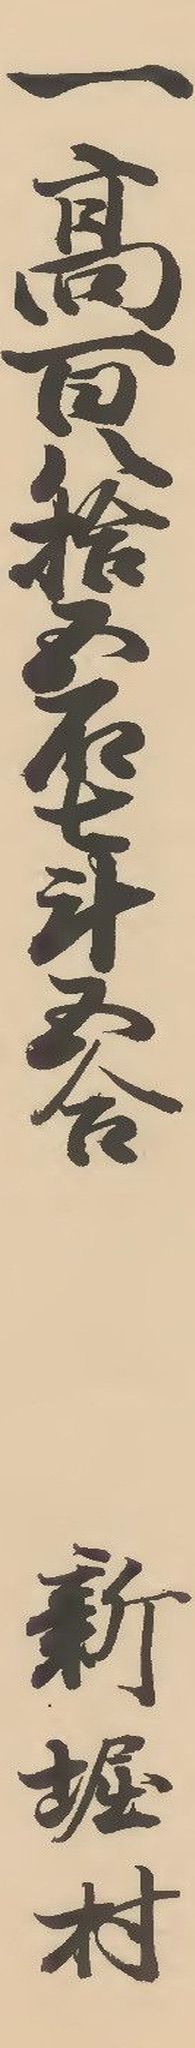一高百八拾五石七斗五合新堀村
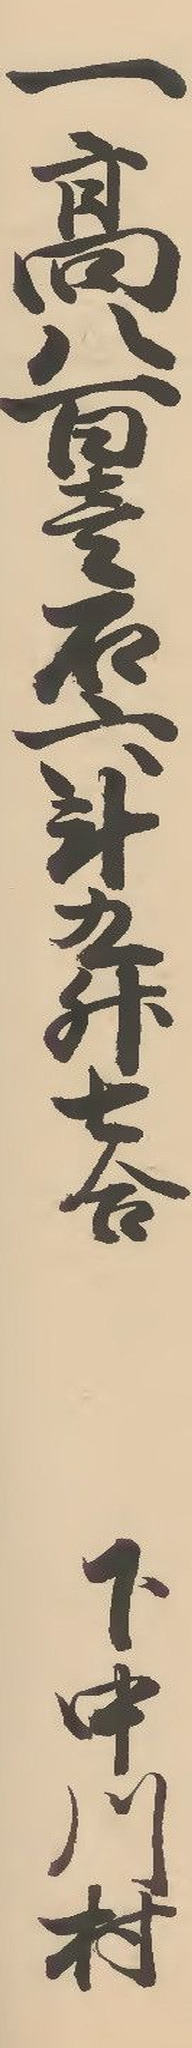一高八百壱石六斗九升七合下中川村
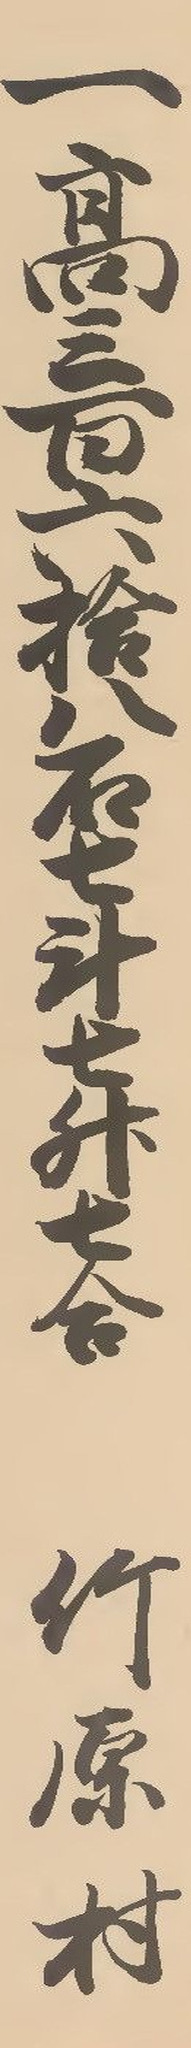一高三百六拾八石七斗七升七合竹原村
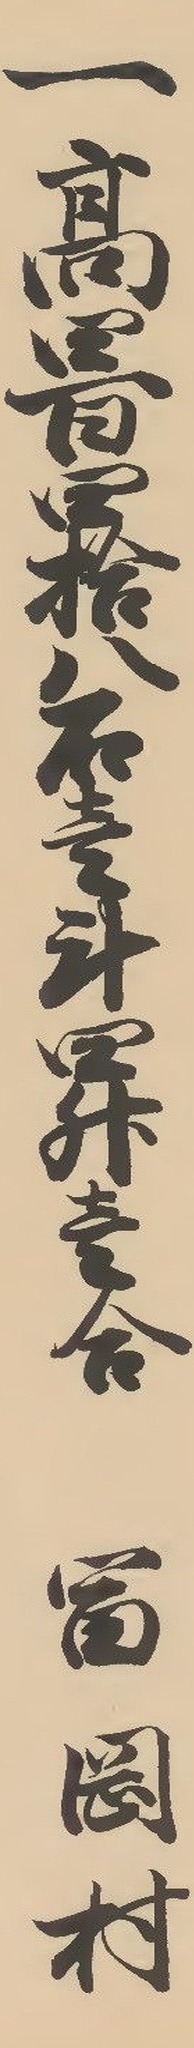一高四百四拾八石壱斗四升壱合冨岡村
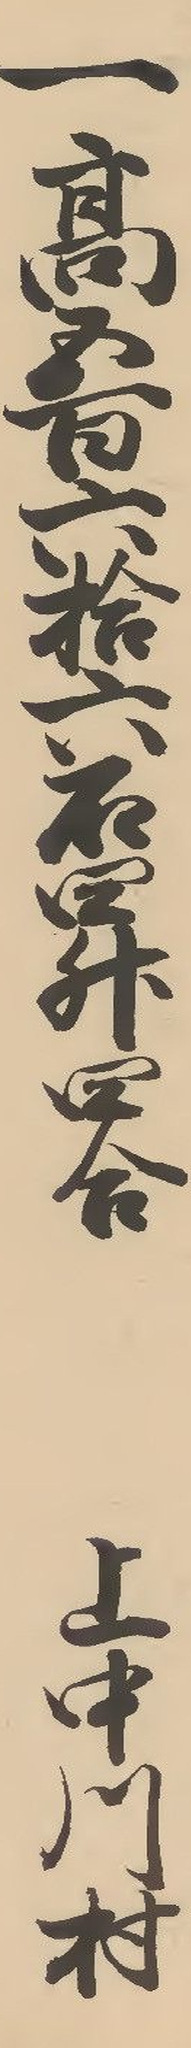一高五百六拾六石四升四合上中川村
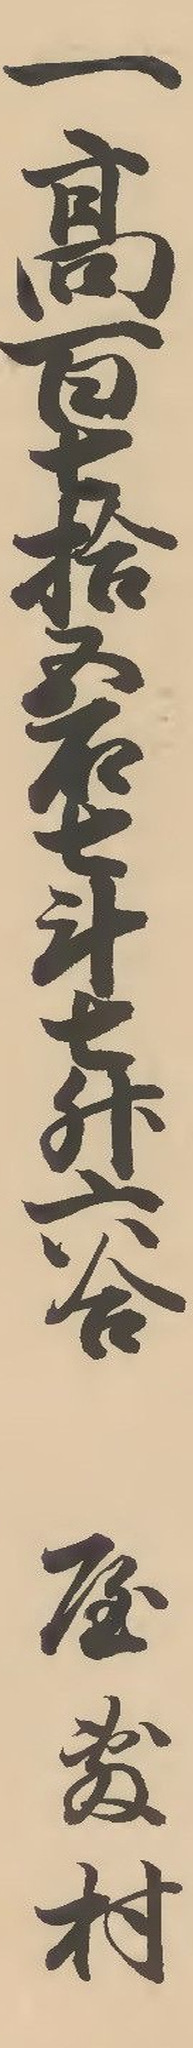一高百七拾五石七斗七升六合屋敷村

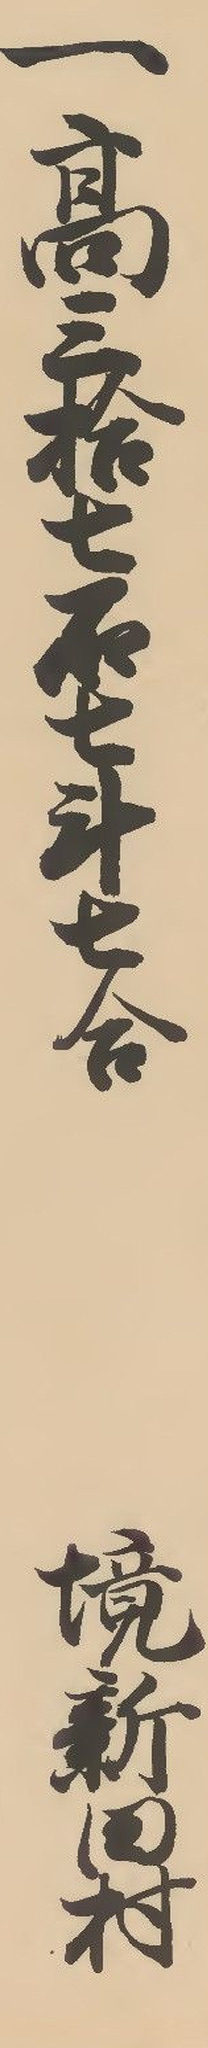一高三拾七石七斗七合境新田村
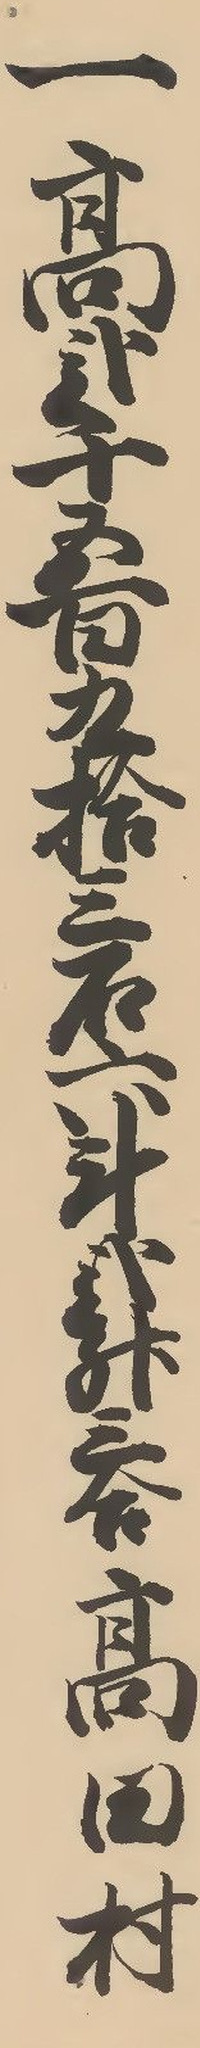一高弐千五百九拾三石六斗弐升三合高田村
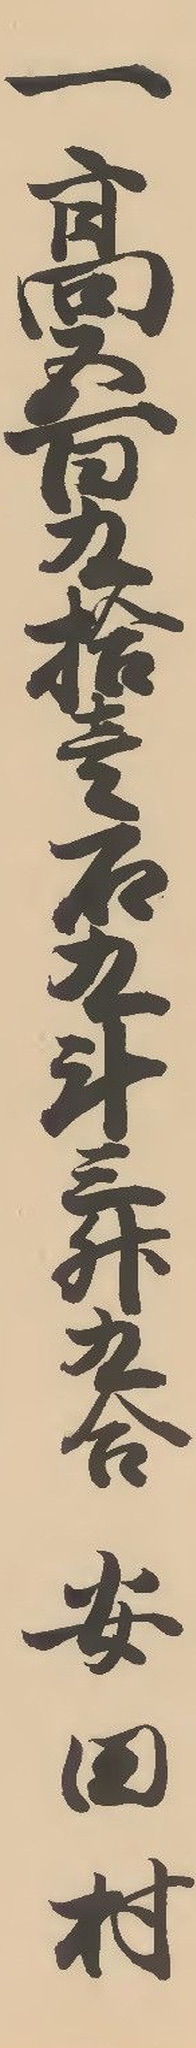一高五百九拾壱石九斗三升九合安田村
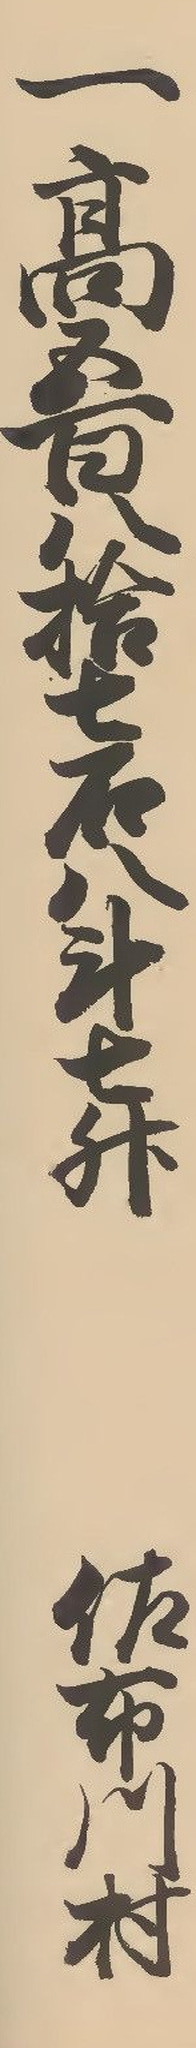一高五百八拾七石八斗七升佐布川村
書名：陸奥国郷帳　１
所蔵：国立公文書館 National Archives of Japan
